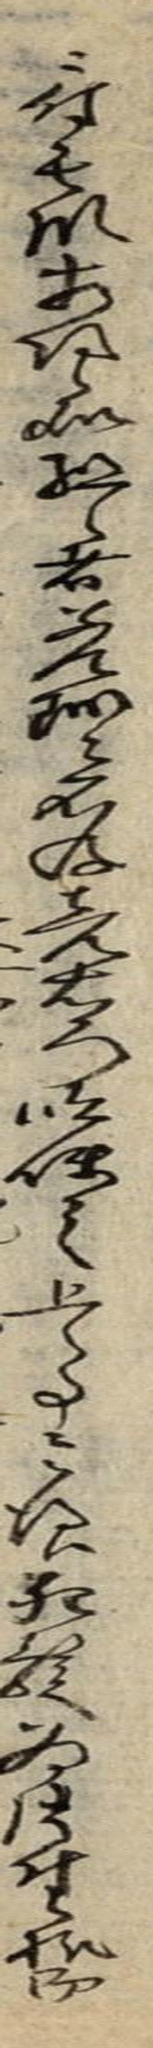に付其段相伺候処組之者差越に不及彦右衛門吟味之上之事に候得は死骸為片付候様御
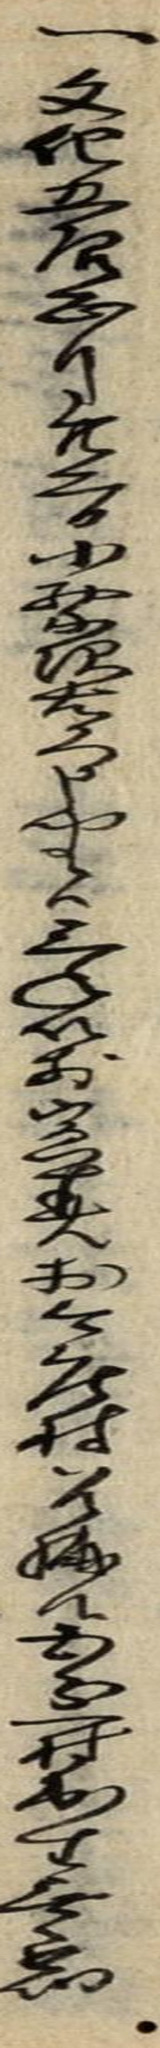一文化五辰正月廿二日小栗次左衛門申聞候は三年以前寅春於今庄村召捕候五分一村出生無宿
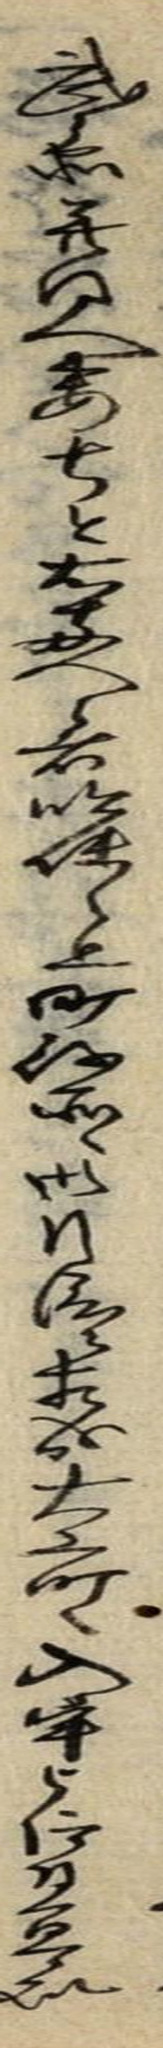武兵衛并同人妻ちと右両人之者吟味之上町役所へ御引渡に相成大工町へ入牢被仰付置候処
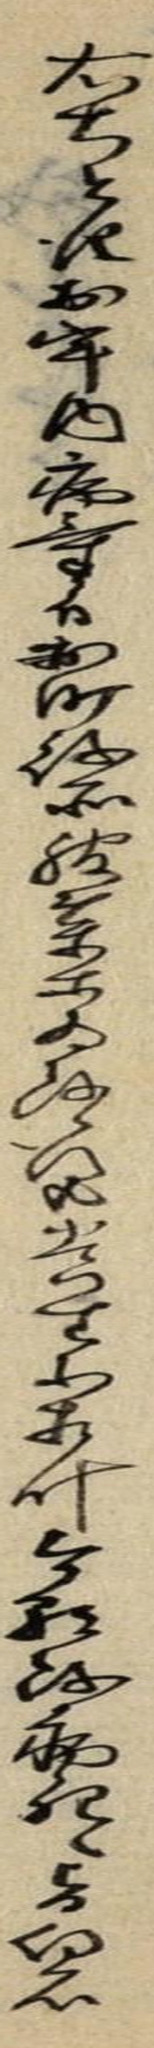右ちと儀於牢内病気に付於町役所服薬等為致候得共養生不相叶今朝致病死候旨白石
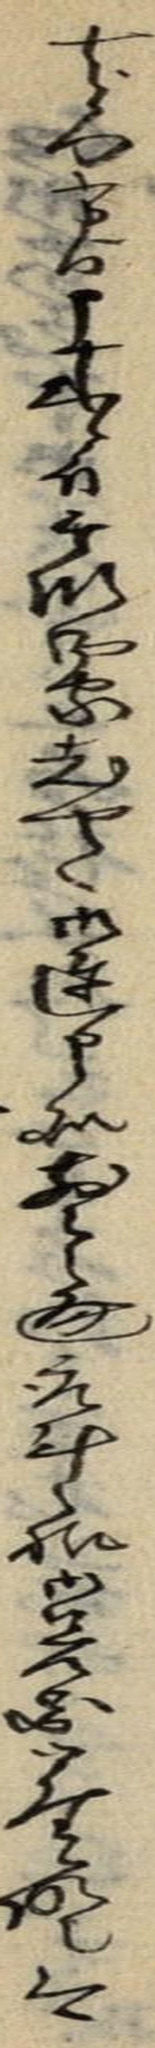十郎右衛門方ゟ申来候に付其段御家老中へ御達申候処前々之通取斗候様御差図御座候仍之今
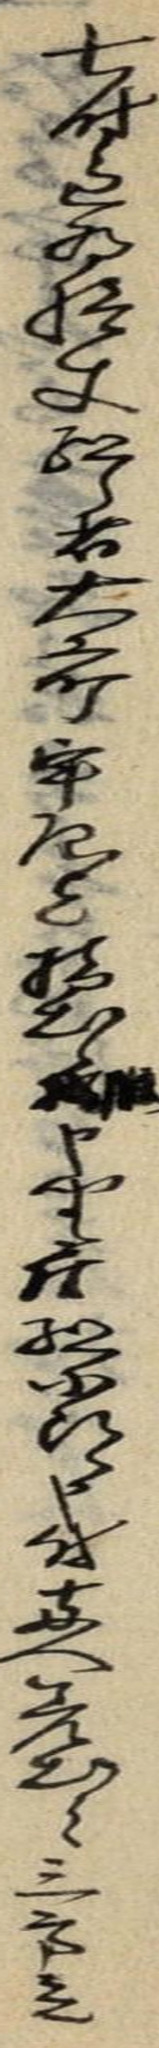七時過為検使組之者大工町牢屋迄指出候段申聞候に付組小頭へ申付両人差出之三方立
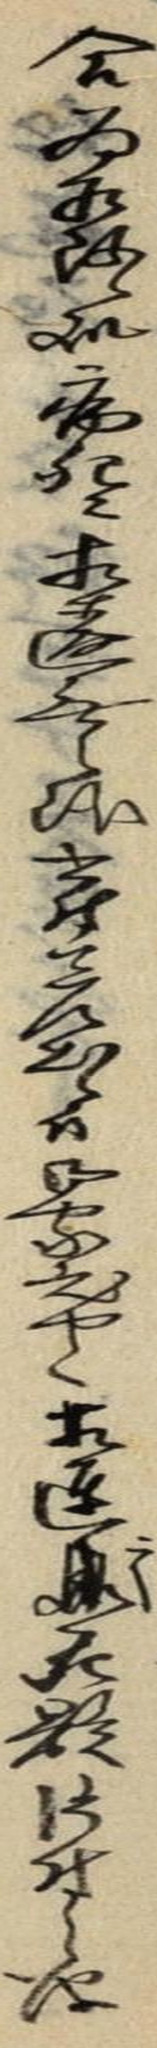合為相改候処病死に相違無之趣書付差出候に付御家老中へ相達候処之死骸片付之儀
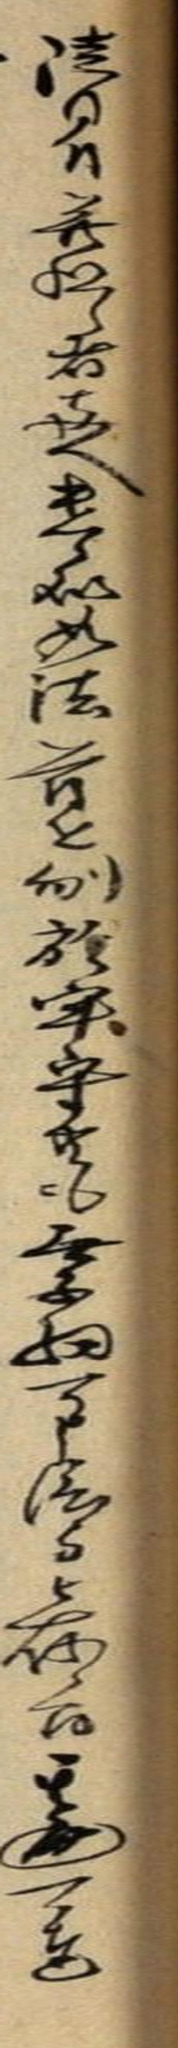徒目付并組之者両人遣候処如法首を刎於牢守共も無子細可申渡と被存候間其通可達
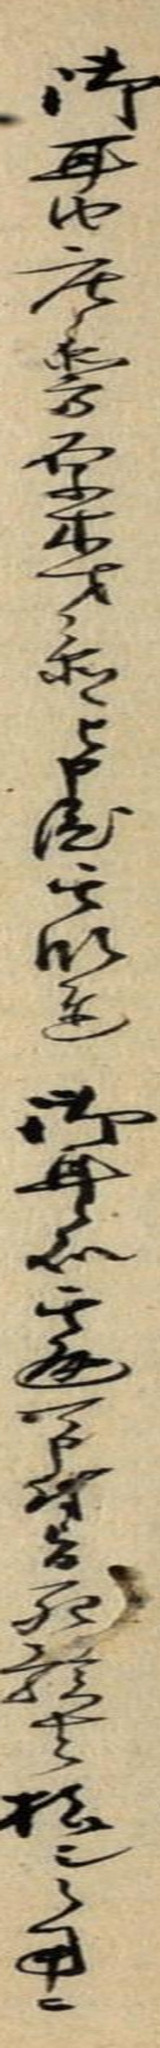御耳由庄兵衛方厚木才兵衛へ被申渡其段達御耳候処其通可申付旨死骸は指シ御用に
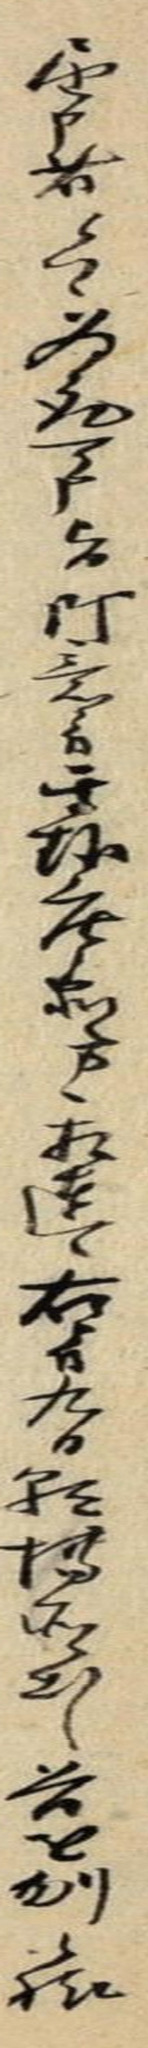望申者候はゝ為取可申旨御意に付其趣庄兵衛方へ相達候右に付九日朝場所へ出し首を刎候様
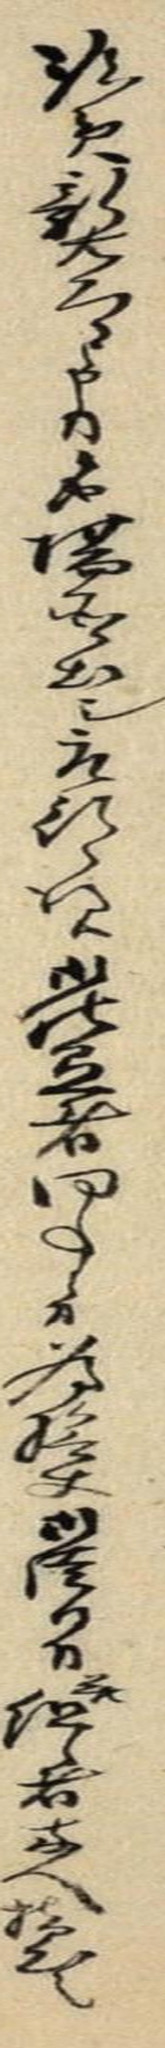渥美新右衛門へ被申付候由場所へ出シ取行候得は御仕置者同事に付為検使御徒目付并組之者両人指出之
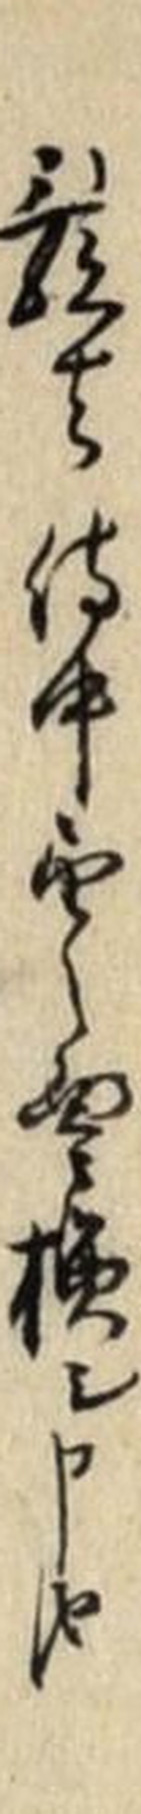骸は侍中望之面々損シ申由
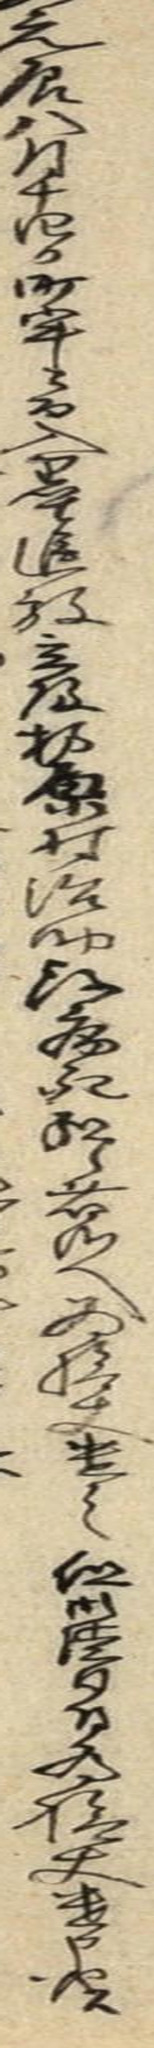一元文元辰八月十四日町牢にて入墨追放立帰栃原村治助致病死組之者弐人為検使遣之但御徒目付為検使遣申儀は
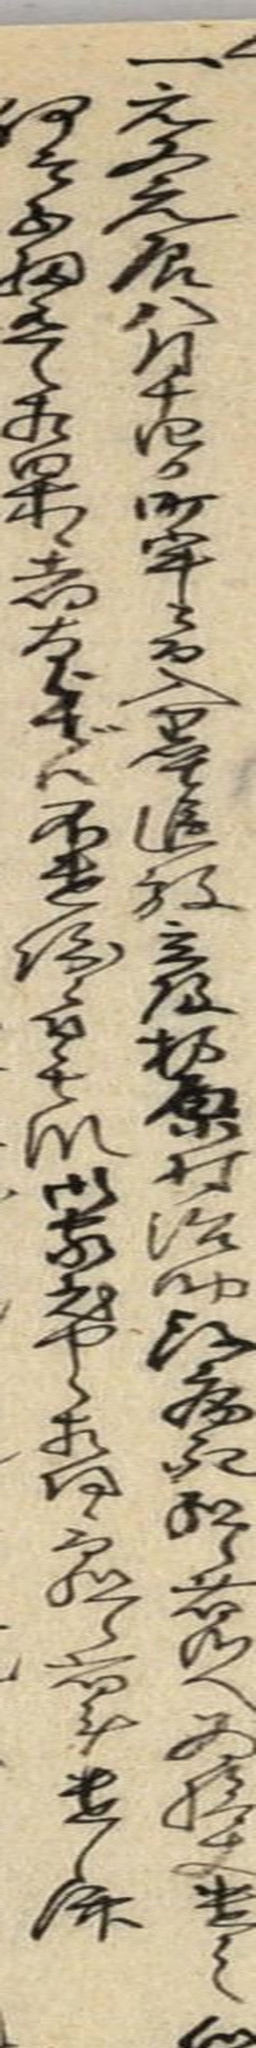何そ子細有之相果候者ならでは不遣儀に付其段御家老中へ相伺候て組之者斗遣し済
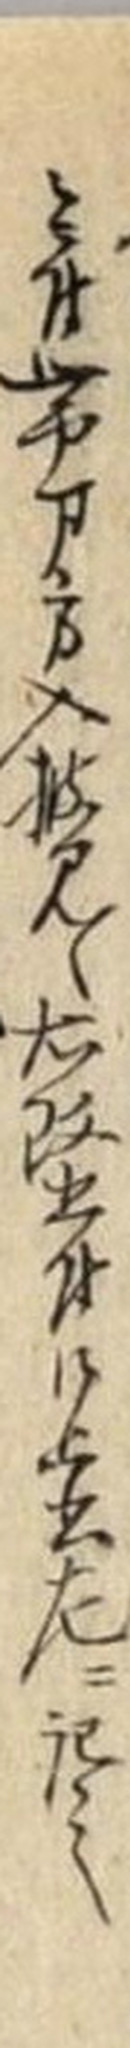候に付帯刀方入披見之右改書付口上書左に記之
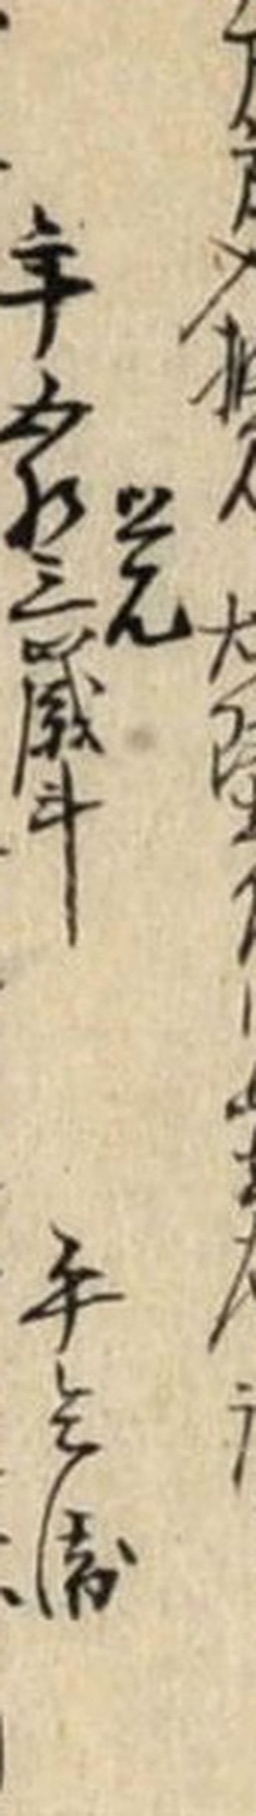年五拾三歳斗平兵衛
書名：御停止異変死失
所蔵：福井県文書館 Fukui Prefectural Archives
